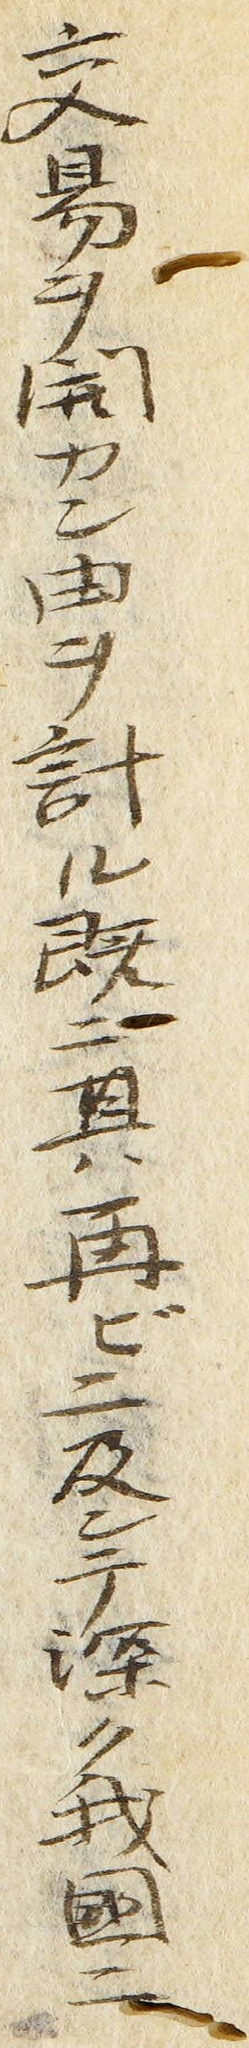交易ヲ開カン由ヲ計ル既ニ其再ビニ及ンテ深ク我国ニ
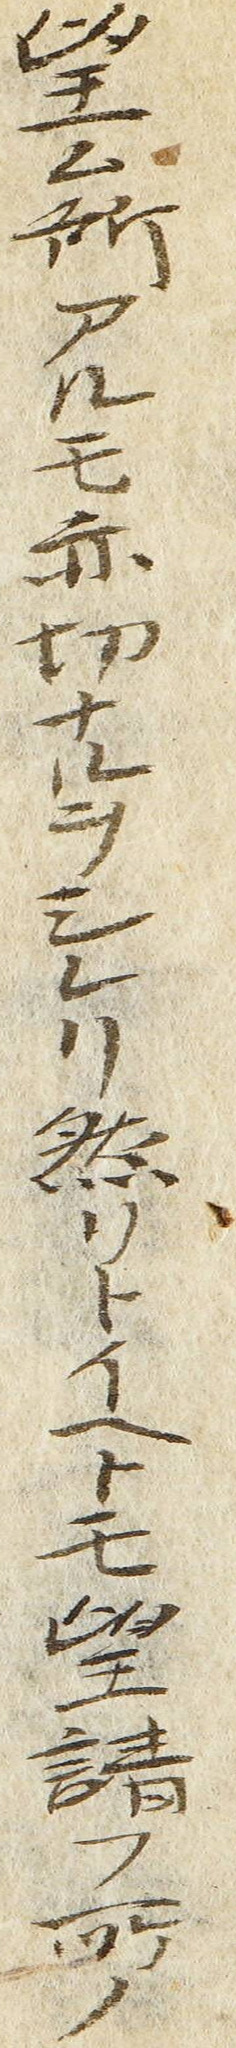望ム所アルモ亦切ナルヲシレリ然リトイヘトモ望請フ所ノ
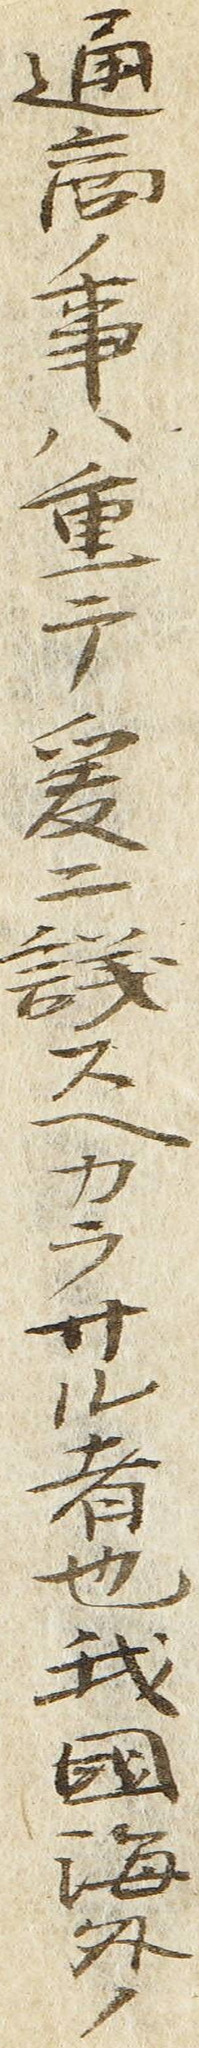通商ノ事ハ重テ爰ニ議スヘカラサル者也我国海外ノ
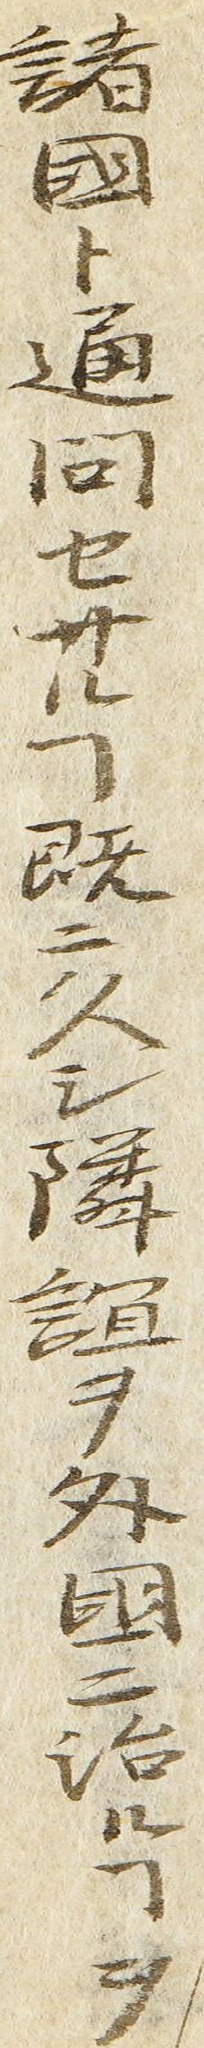諸国ト通問セサルヿ既ニ久シ隣誼ヲ外国ニ治ルヿヲ
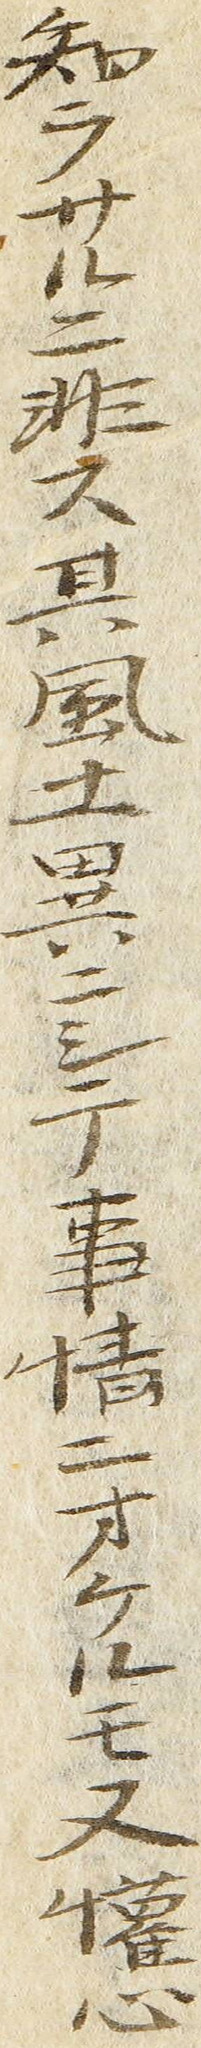知ラサルニ非ス其風土異ニシテ事情ニオケルモ又懽心
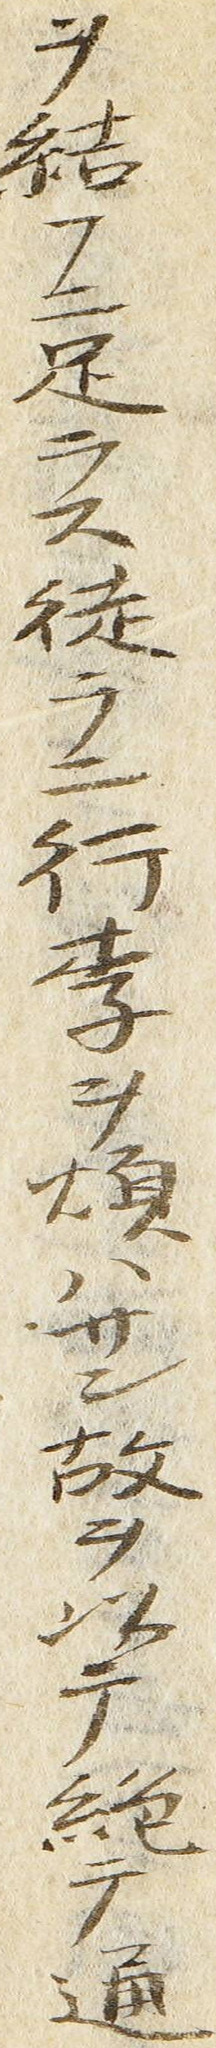ヲ結フニ足ラス徒ラニ行李ヲ煩ハサン故ヲ以テ絶テ通
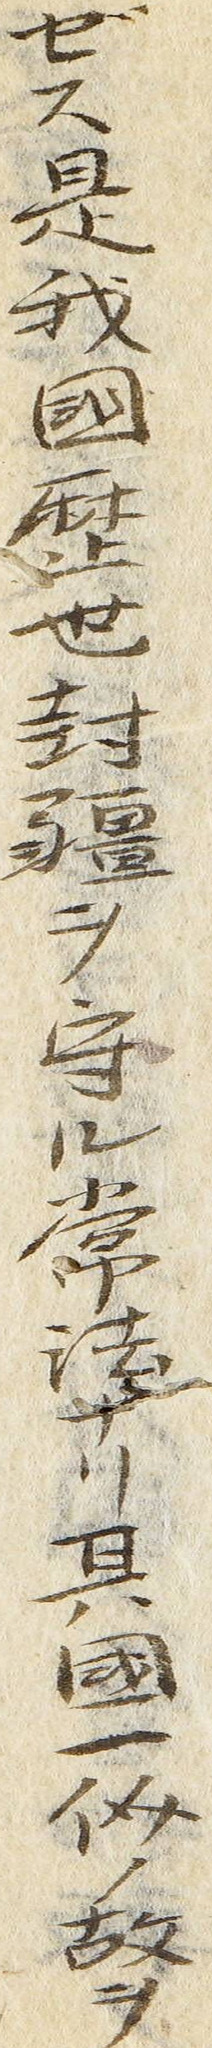ゼス是我国歴世封彊ヲ守ル常法ナリ其国一介ノ故ヲ
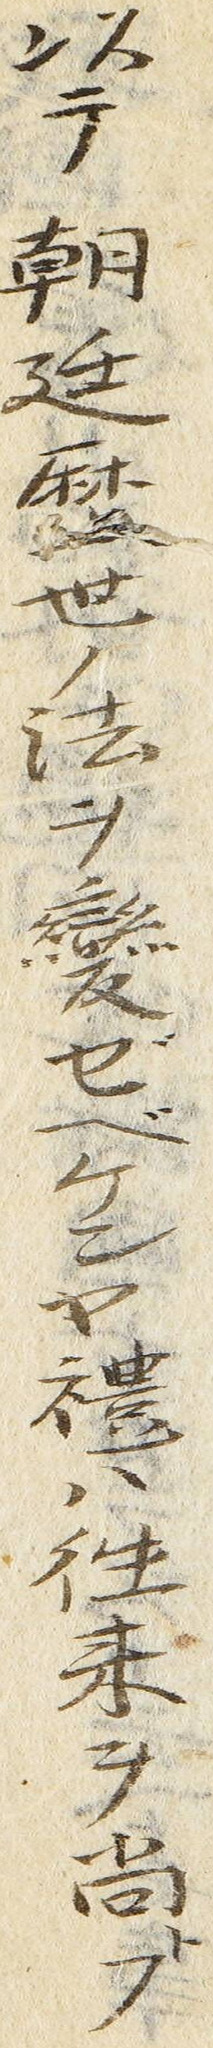以テ朝廷歴世ノ法ヲ変ゼベケンヤ礼ハ往来ヲ尚トフ
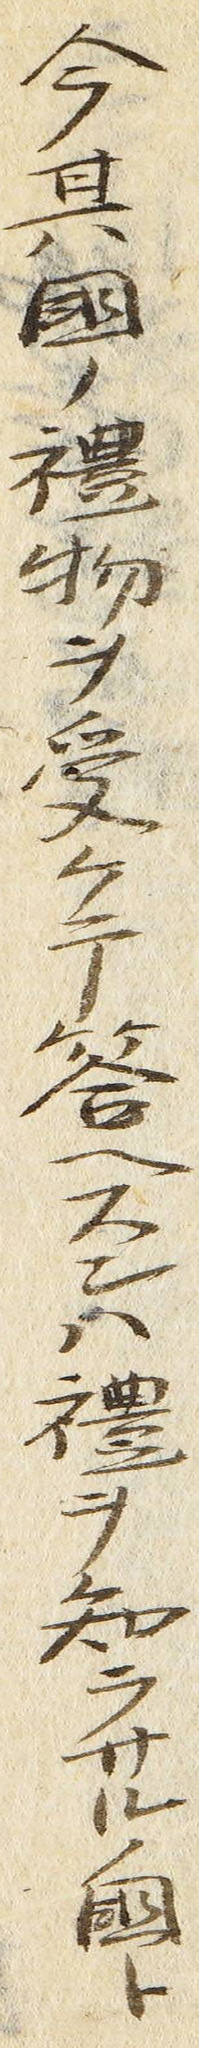今其国ノ礼物ヲ受ケテ答ヘスンハ礼ヲ知ラサルノ国ト
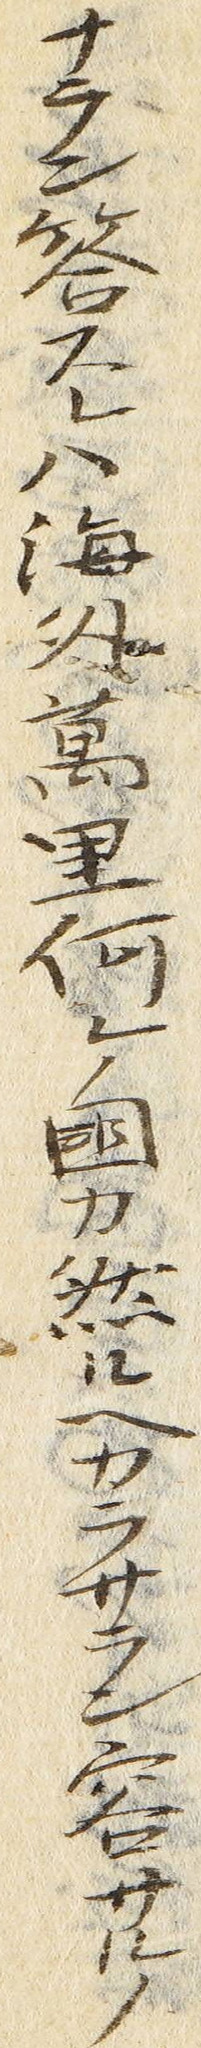ナラン答スレハ海外万里何レノ国カ然ルヘカラサラン容サルノ
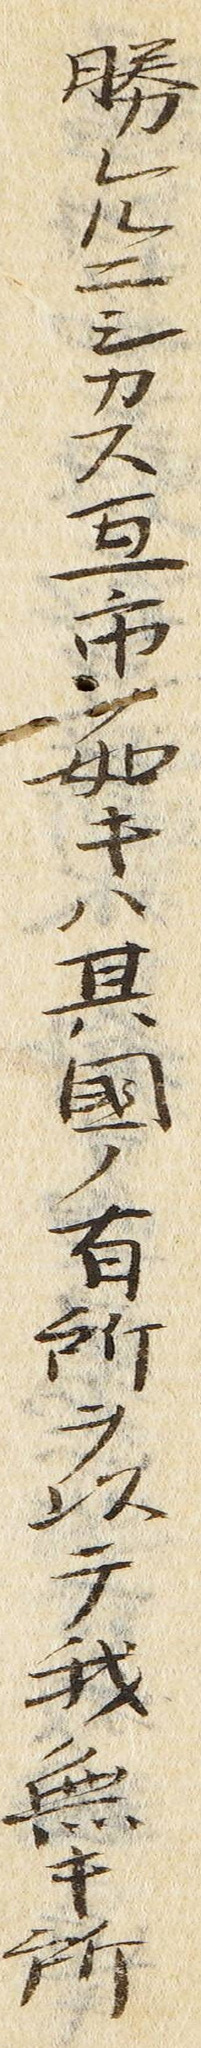勝レルニシカス互市ノ如キハ其国ノ有所ヲ以テ我無キ所
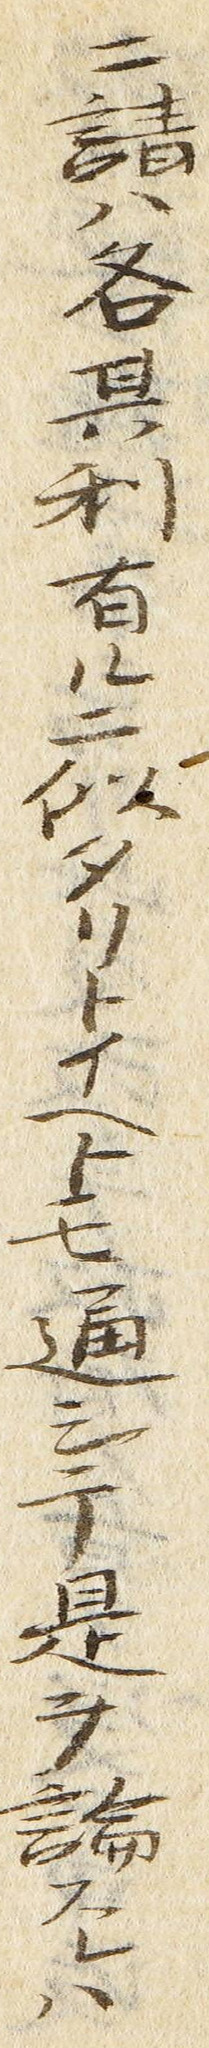ニ請ハ各其利有ルニ似タリトイヘトモ通シテ是ヲ論スレハ
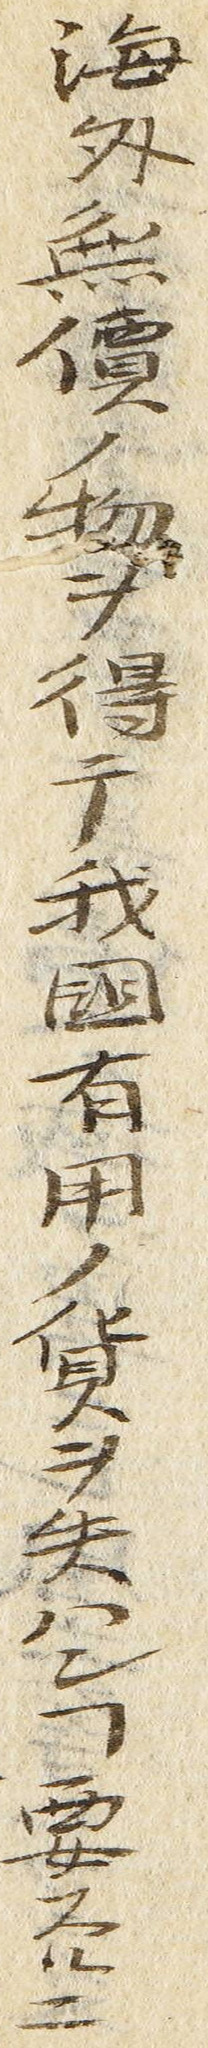海外無価ノ物ヲ得テ我国有用ノ貨ヲ失ハンヿ要スルニ
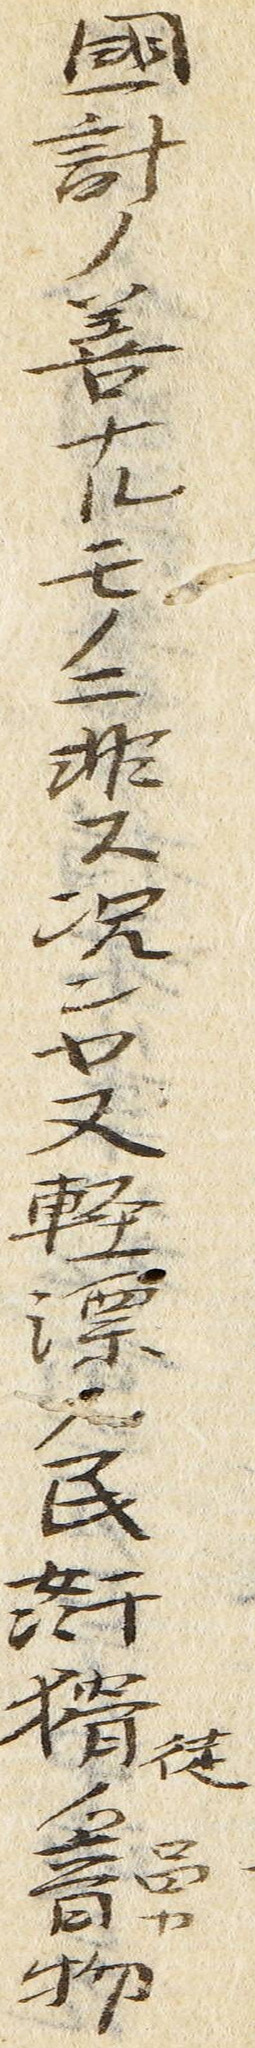国計ノ善ナルモノニ非ス况ンヤ又軽漂ノ民奸猾ノ徒音物
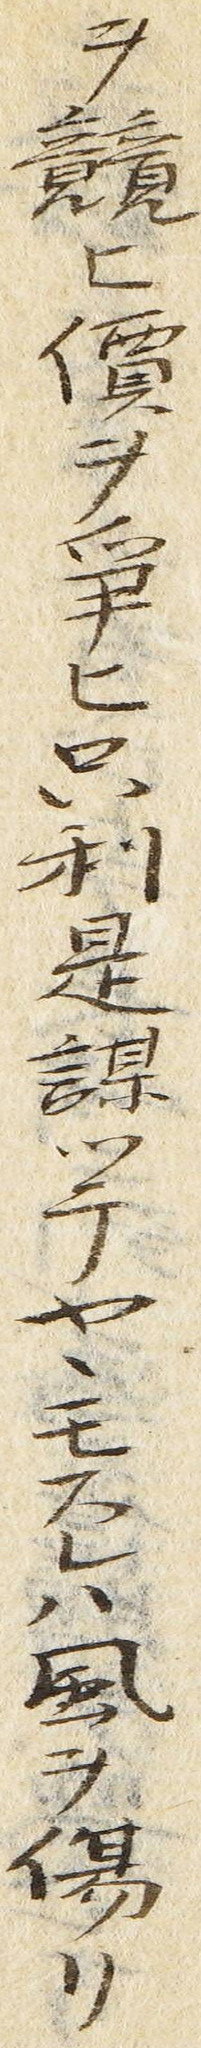ヲ競ヒ価ヲ争ヒ只利是謀ツテヤヽモスレハ風ヲ傷リ
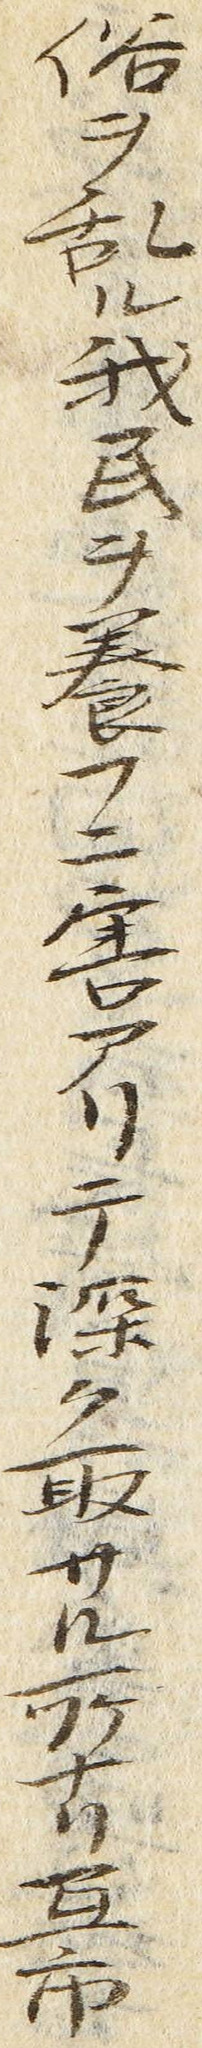俗ヲ乱ル我民ヲ養フニ害アリテ深ク取サル所ナリ互市
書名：漂民後記
